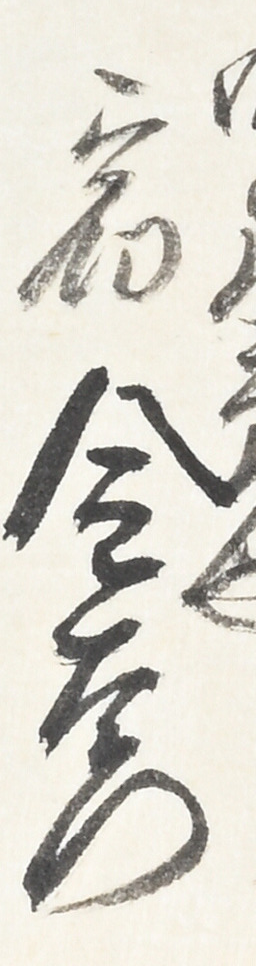宿金右衛門
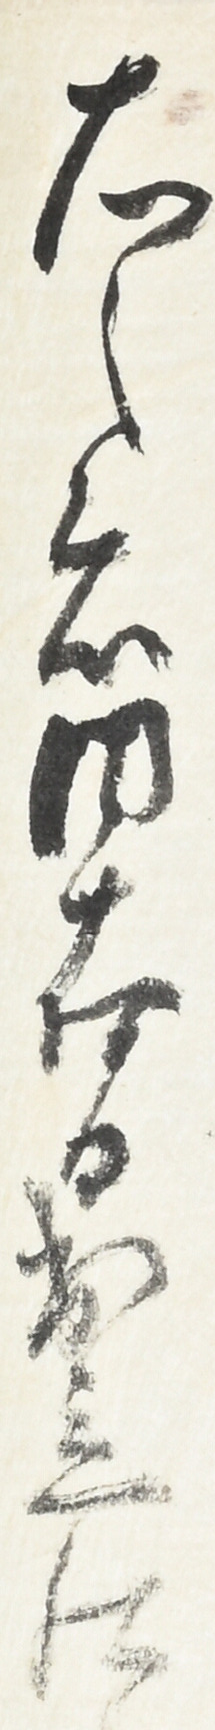右之者同十四日出立仕候
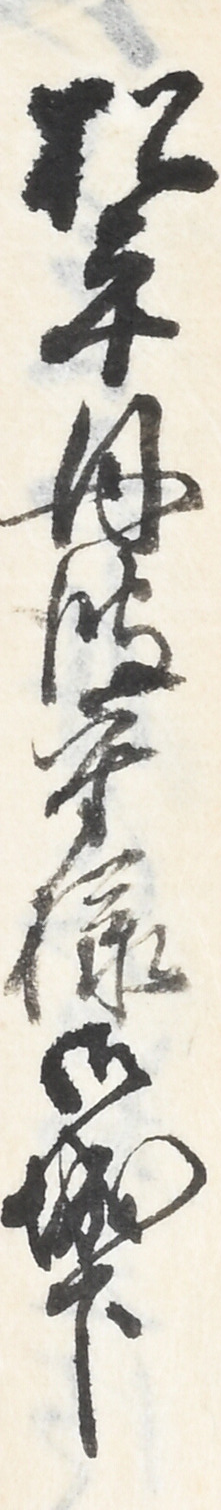松平丹波守様御領分
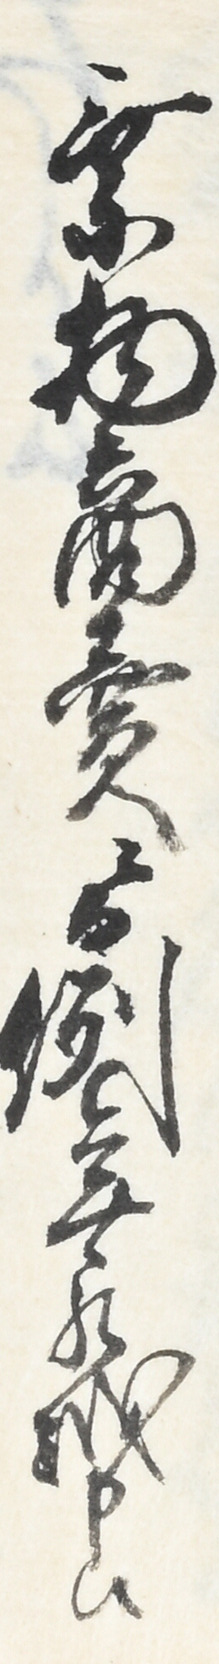小間物商売ニ而例年罷越申候

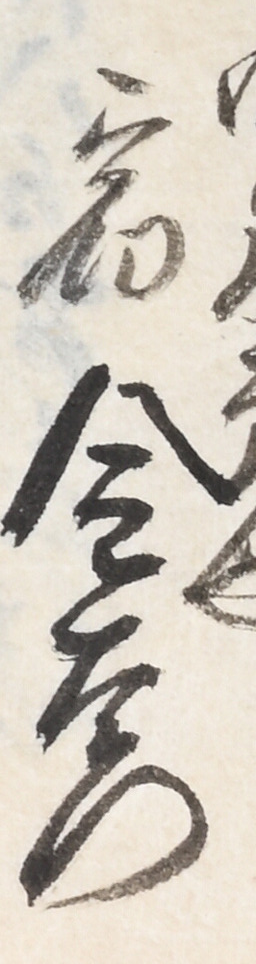宿吉左衛門
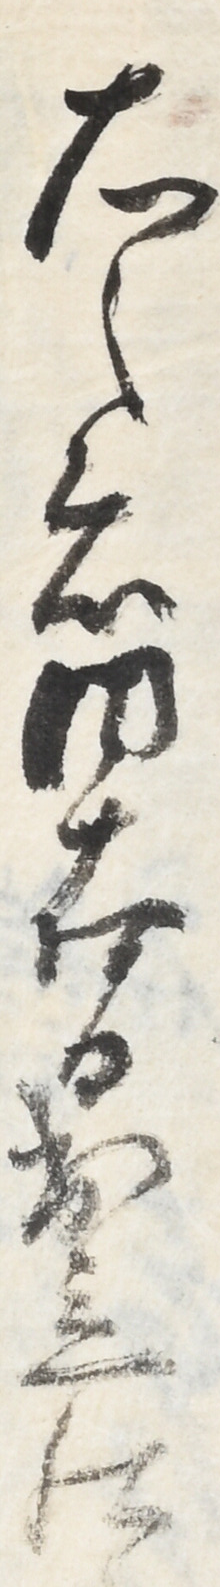右之者同廿七日出立仕候
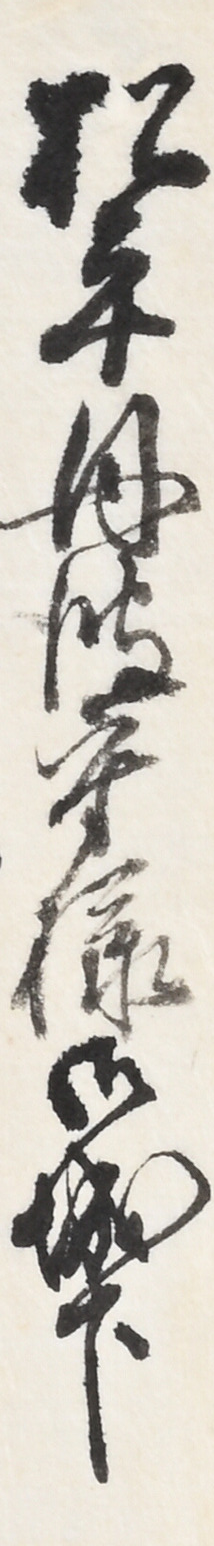松平丹波守様御城下
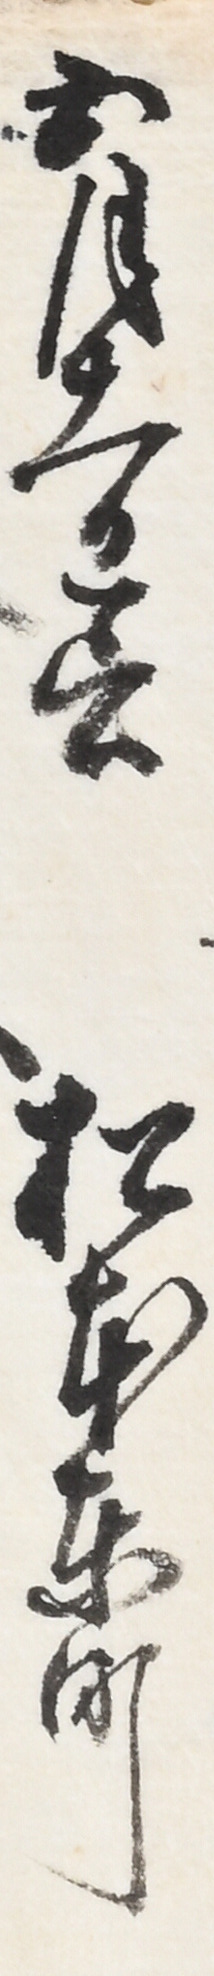五月十一日着松本東町
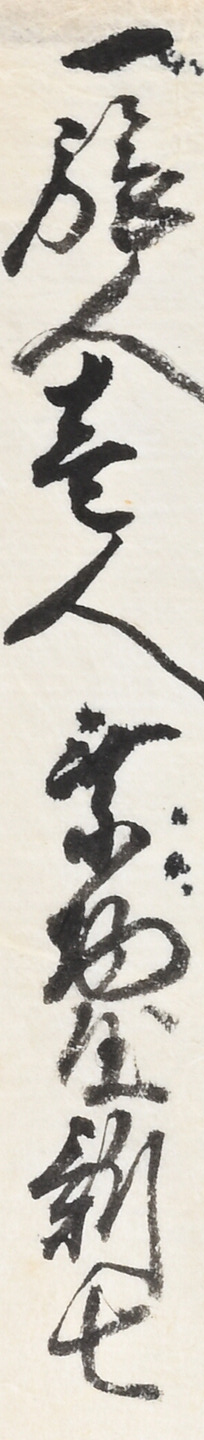一旅人壱人乗物屋新七
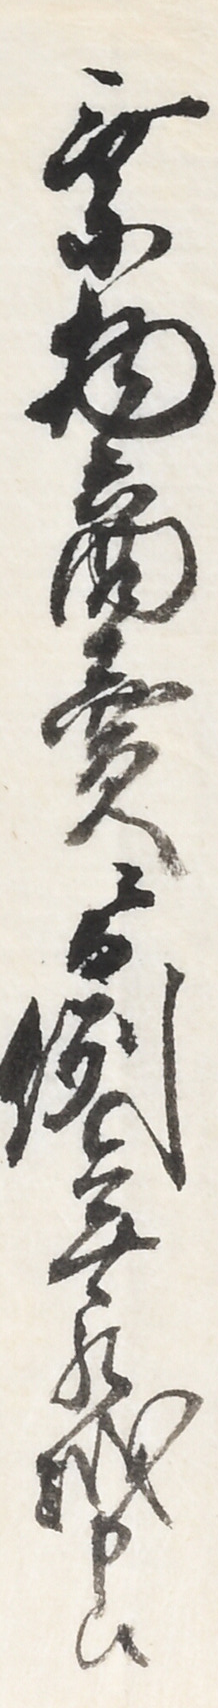乗物商売ニ而例年罷越申候
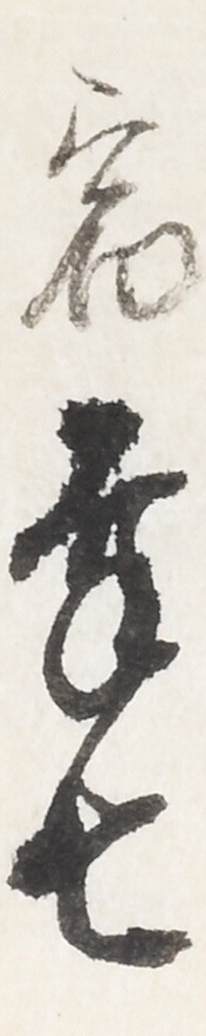宿幸七
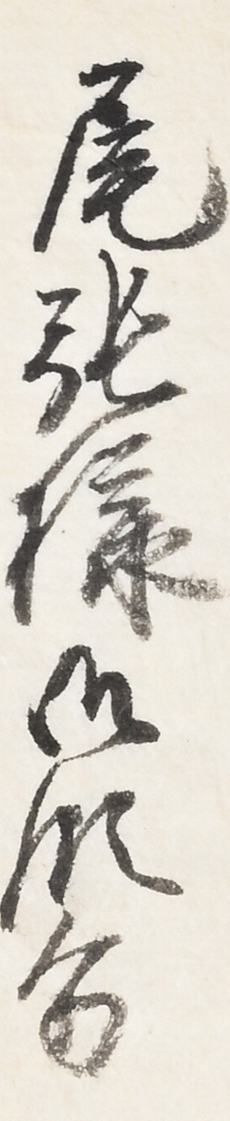尾張様御領分
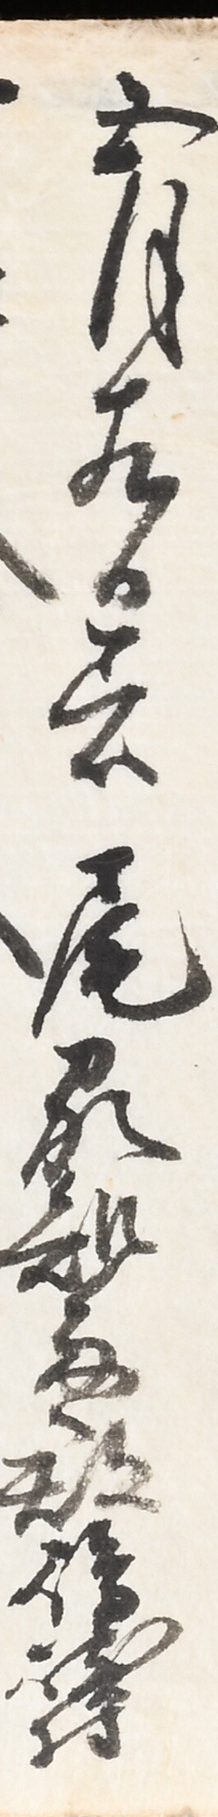五月十九日着尾州知多郡嶋崎村
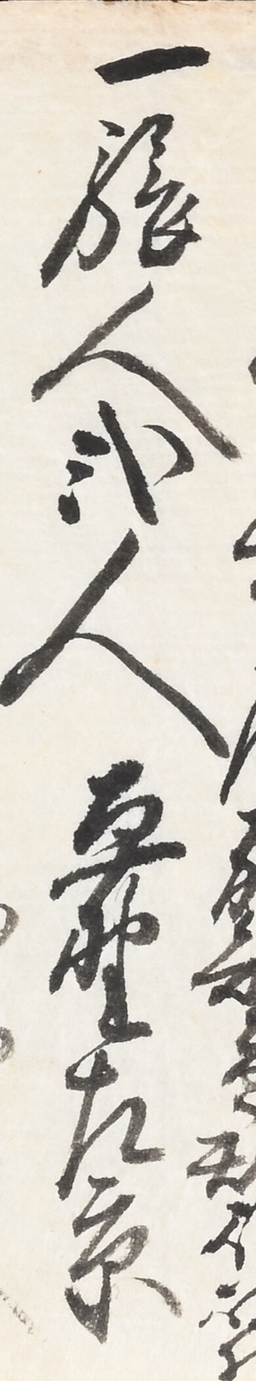一旅人弐人草野左京
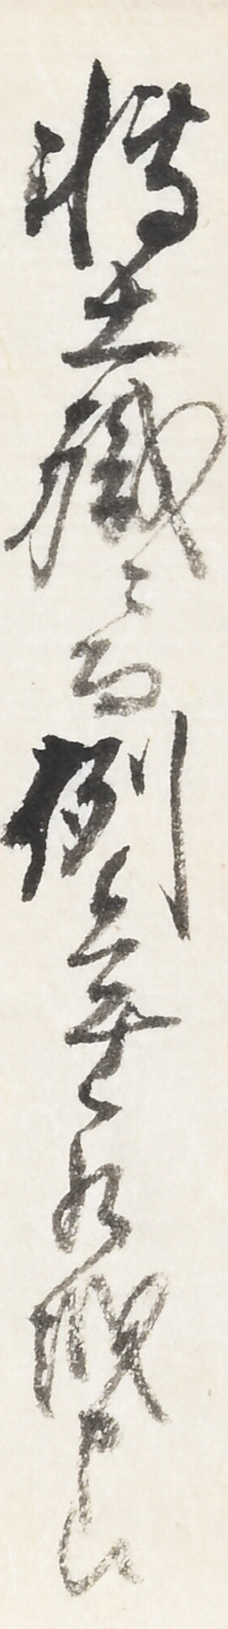転士職ニ而例年罷越申候
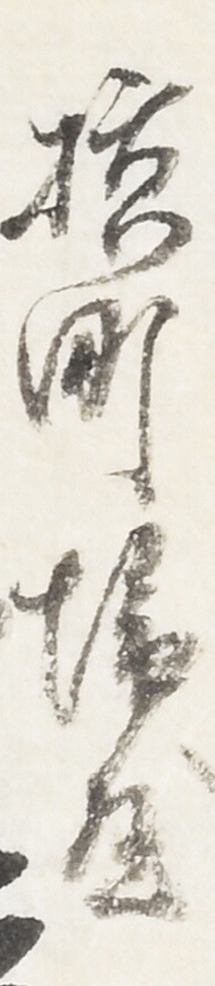横町塩屋
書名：旅人泊控帳
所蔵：伊那市立高遠町図書館・合同会社AMANE
